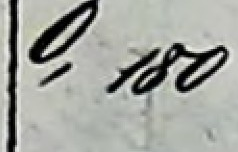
0,180
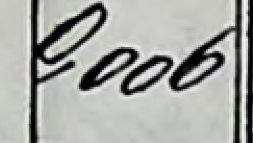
0,006
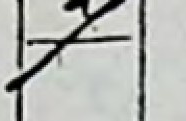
7
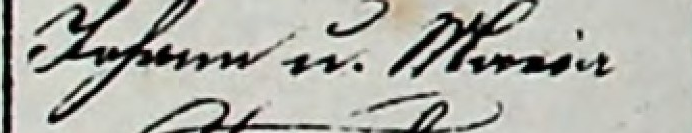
Johann u. Maria
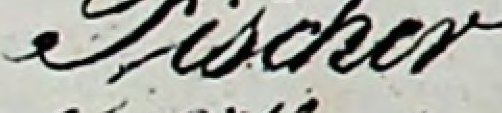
Pischer
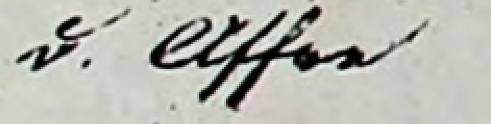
v. Affon
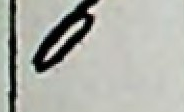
6
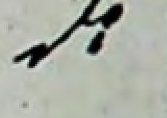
do
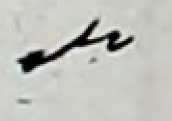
do
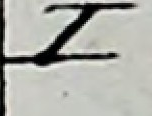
I
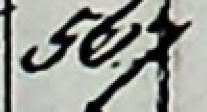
567
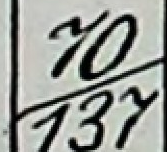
70/137
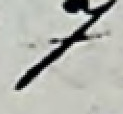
7
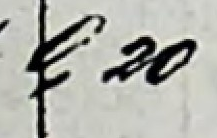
0,20
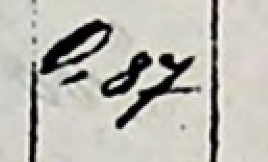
0,87
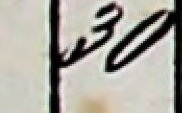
30
